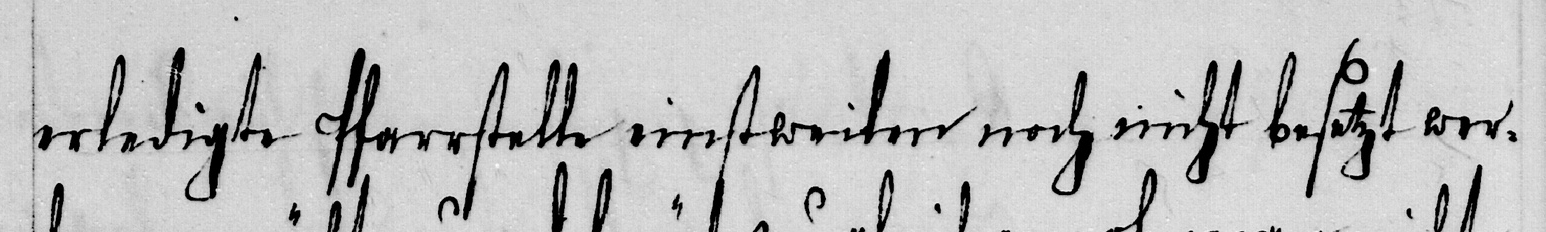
erledigte Pfarrstelle einstweilen noch nicht besetzt wer¬
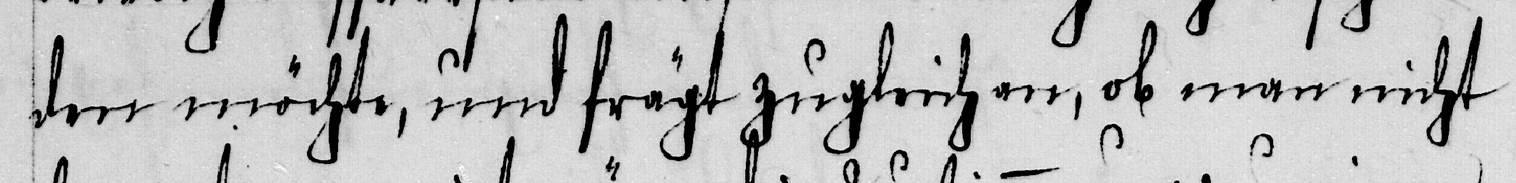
den möchte, und fragt zugleich an, ob man nicht
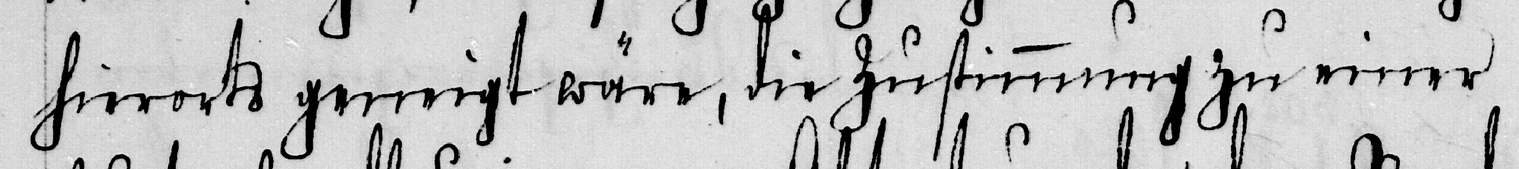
hierorts geneigt wäre, die Zustimmung zu einer
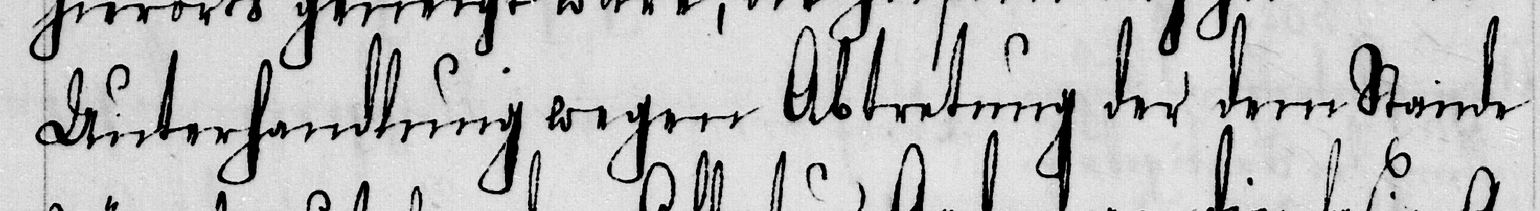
Unterhandlung wegen Abtretung der dem Stande
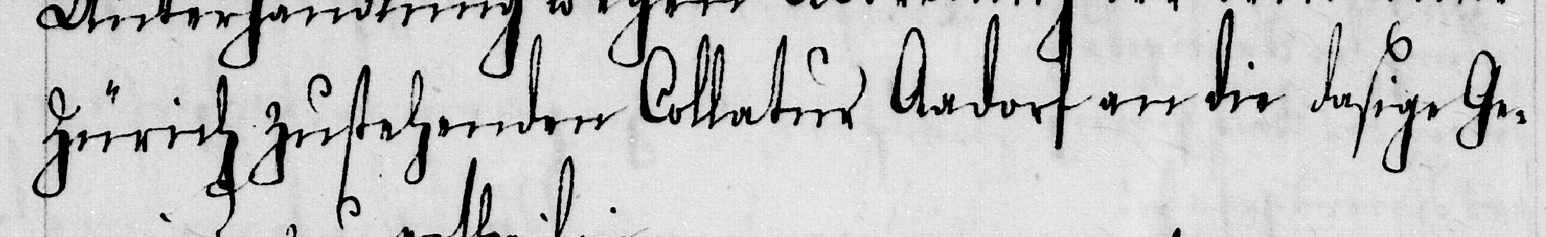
Zürich zustehenden Collatur Aadorf an die dasige Ge¬
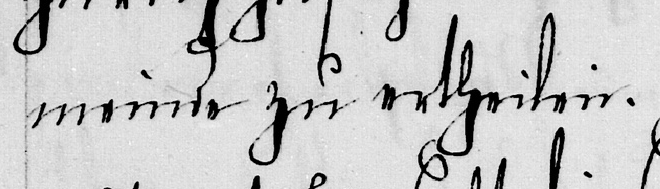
meinde zu ertheilen.
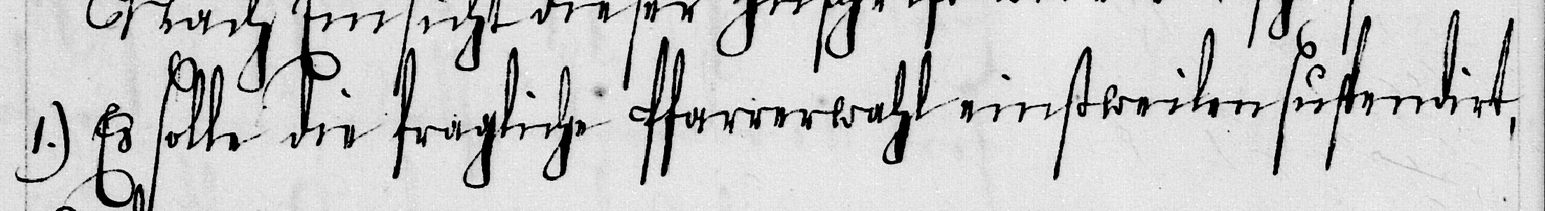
Es solle die fragliche Pfarrerwahl einstweilen suspendie¬
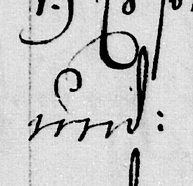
und:
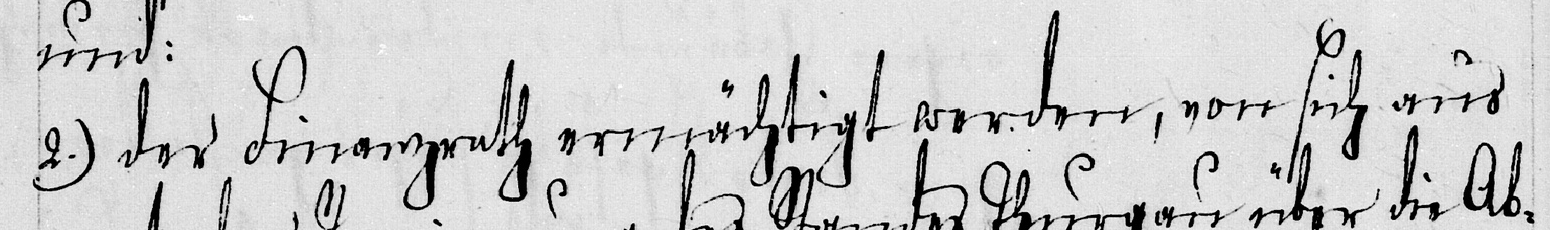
2.) der Finanzrath ermächtigt werden, von sich aus
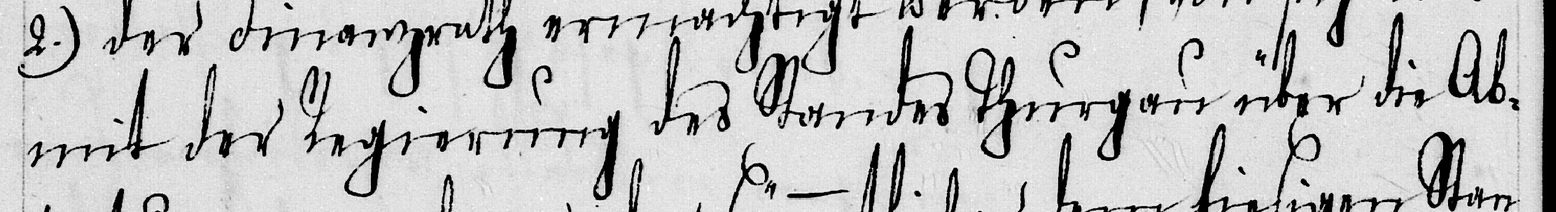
mit der Regierung des Standes Thurgau über die Ab¬
